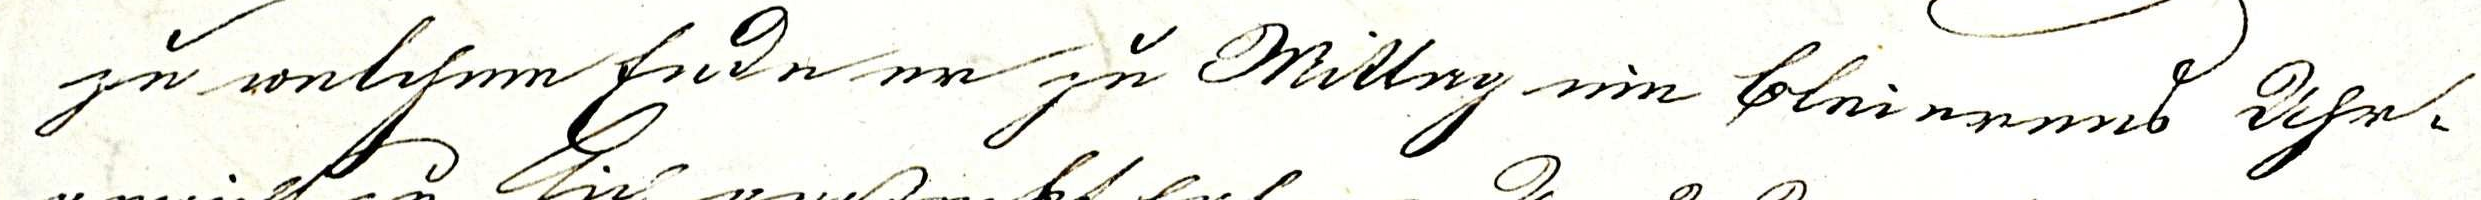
zu welchem Ende er zu Mittag ein bleiernes Uhr¬
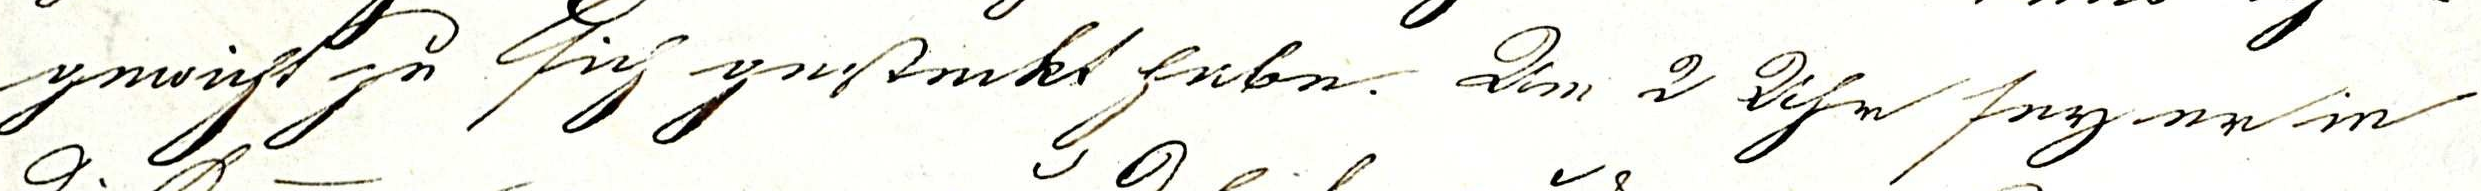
gewicht zu sich gesteckt habe. Am 2 Uhr sey er in
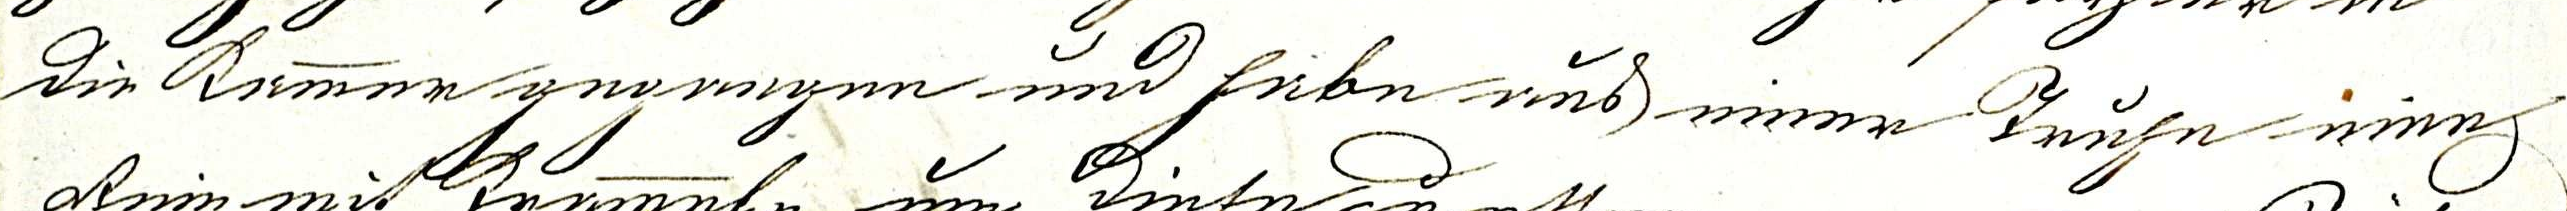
die Kammer gegangen und habe aus einer Truhe eine
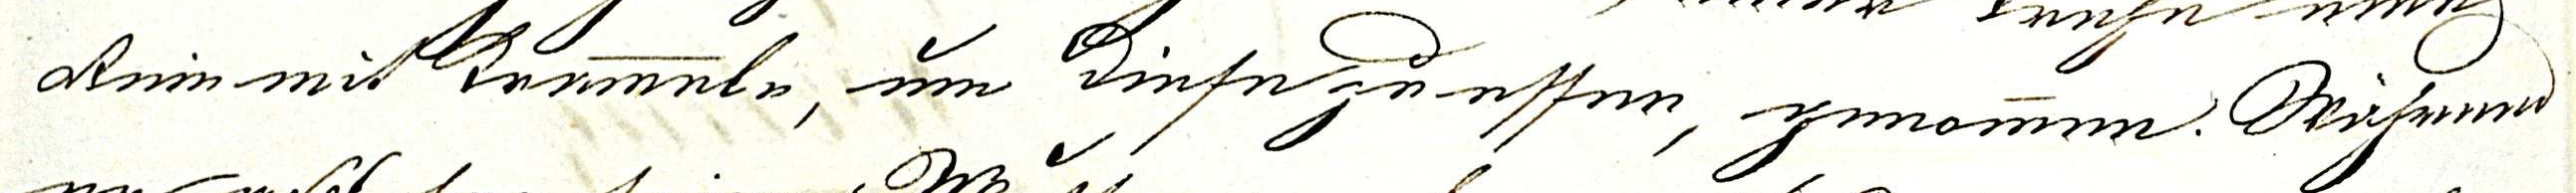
Rein mit Krammeln, um diese zu essen, genommen. Während
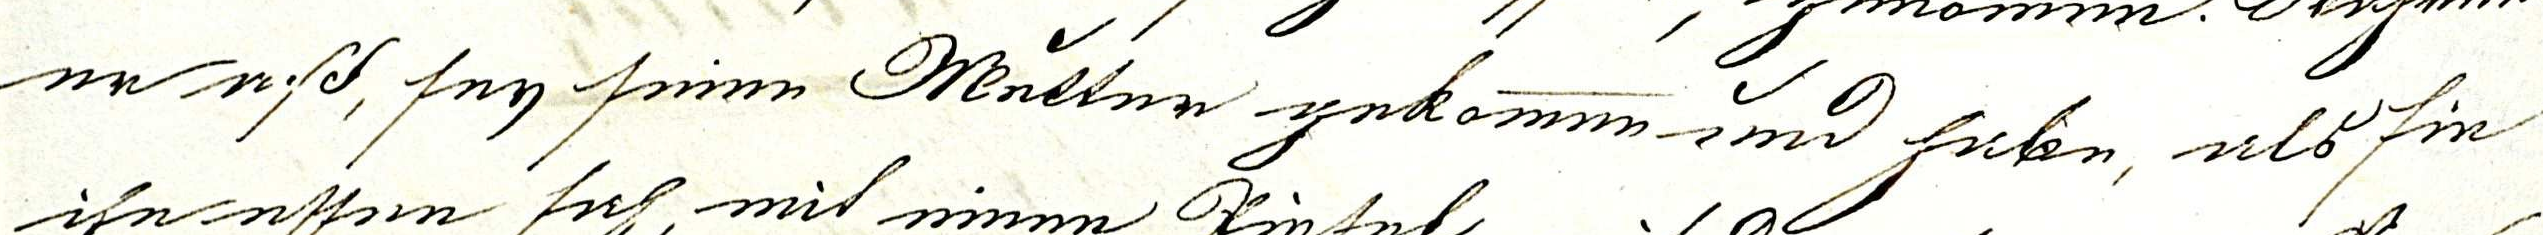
er aß, sey seine Mutter gekommen und habe als sie
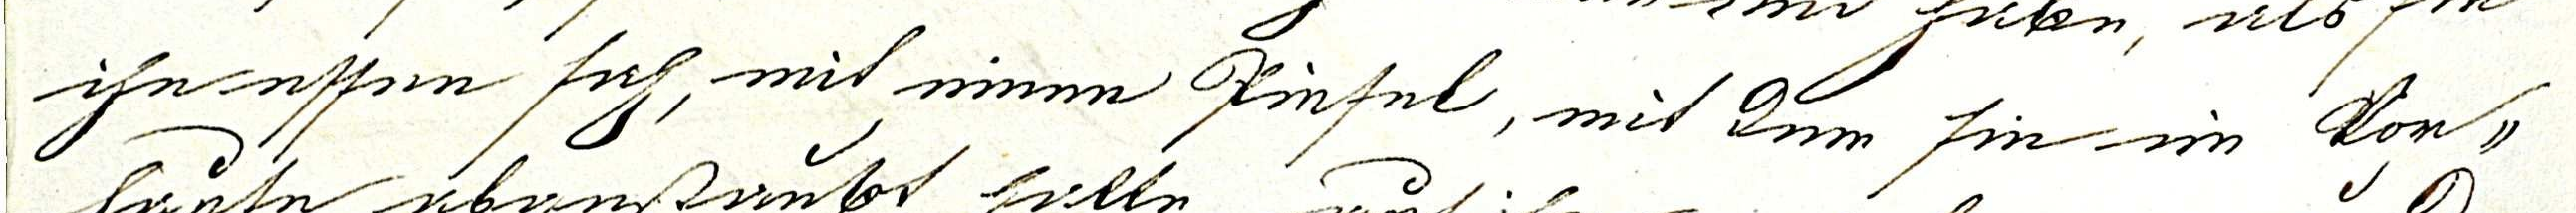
ihn essen sah, mit einen Pinsel, mit dem sie im Vor¬
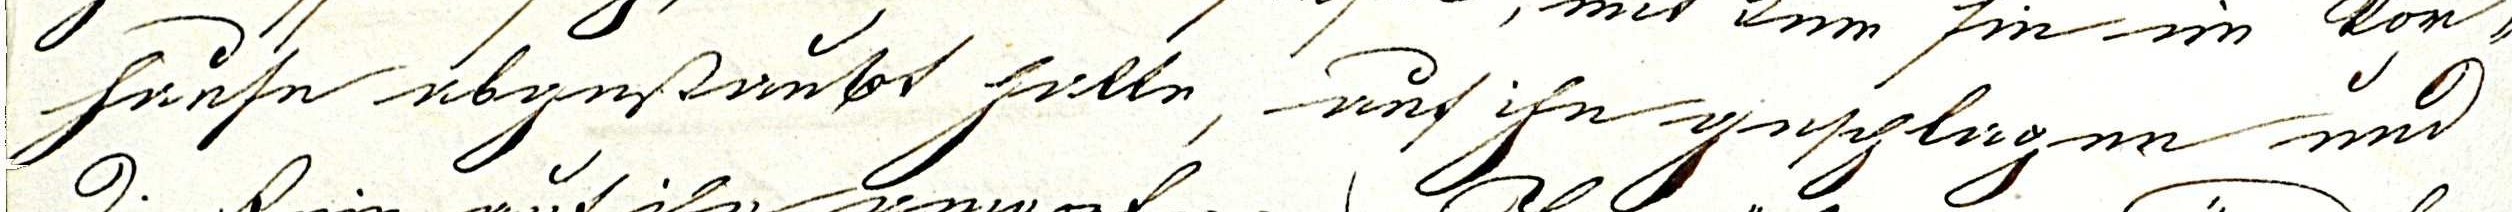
hause abgestaubt hatte, auf ihn geschlagen und
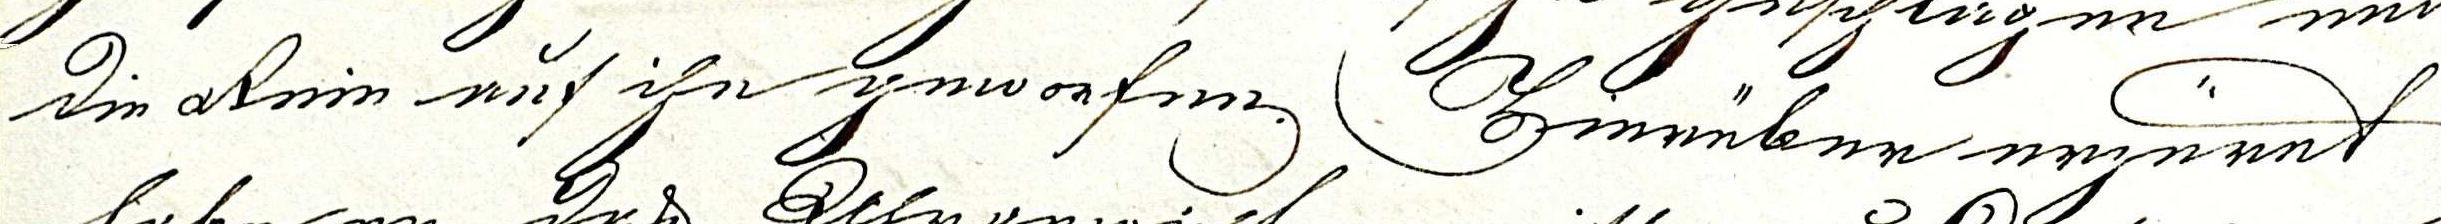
die Rein auf ihn geworfen. Hierüber erzürnt
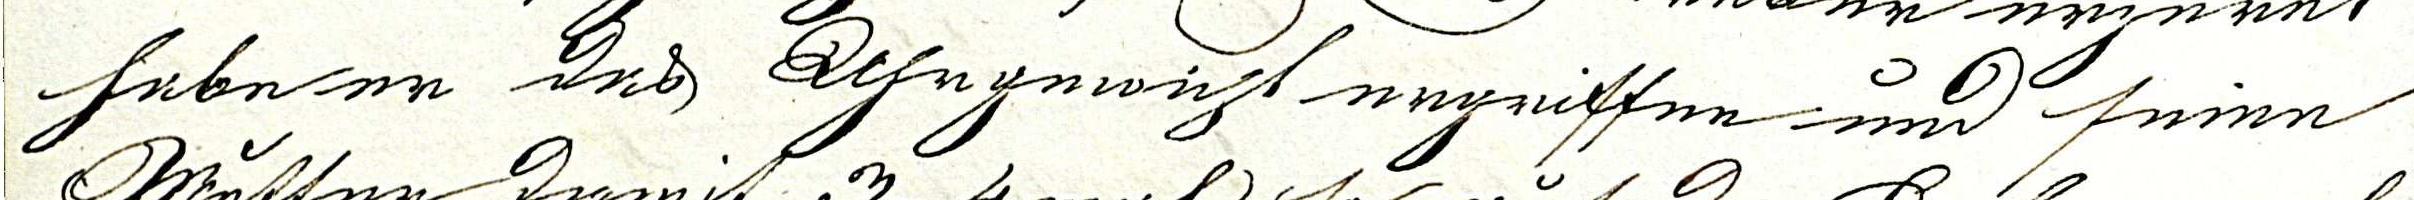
habe er das Uhrgewicht ergriffen du seine
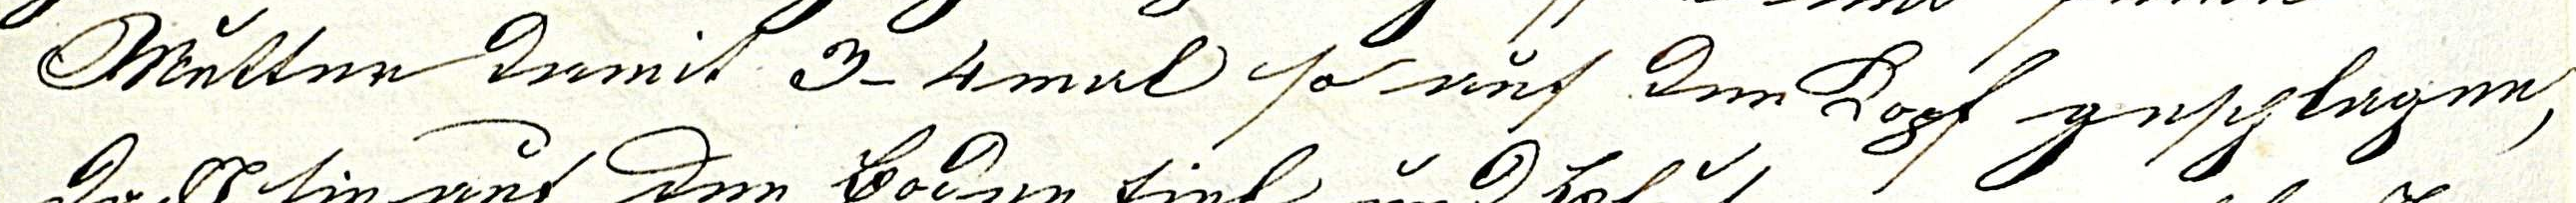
Mutter damit 3-4al so auf den Kopf geschlagen,
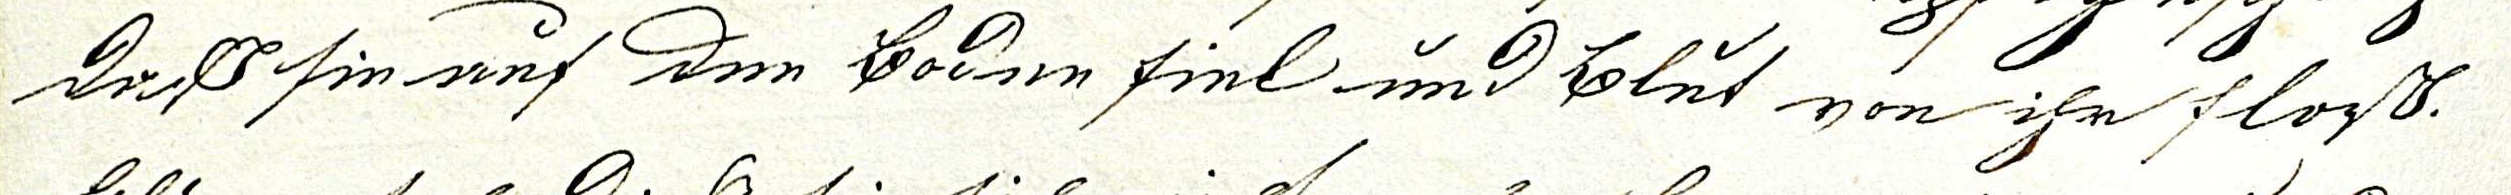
daß sie auf den Boden fiel und Blut von ihr floß.
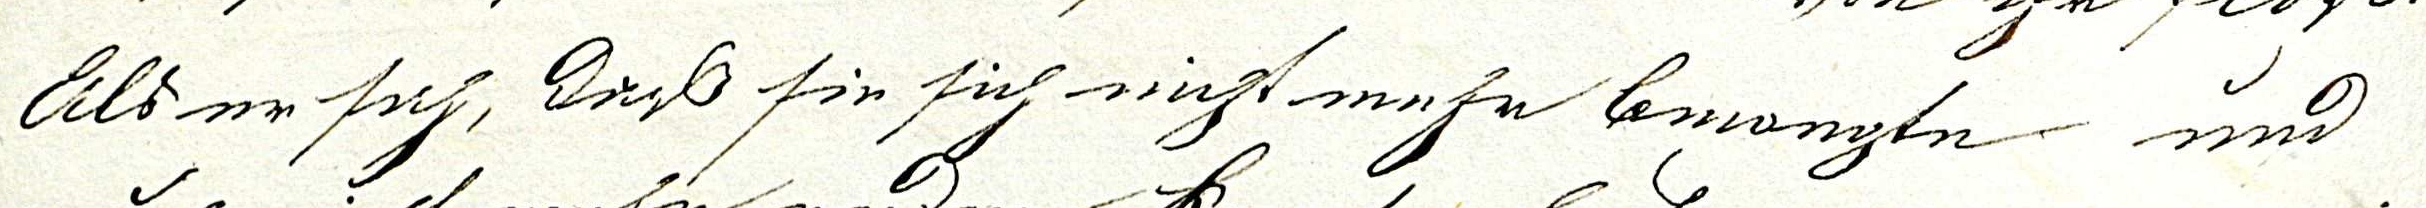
Als er say, daß sie sich nicht mehr bewegte und
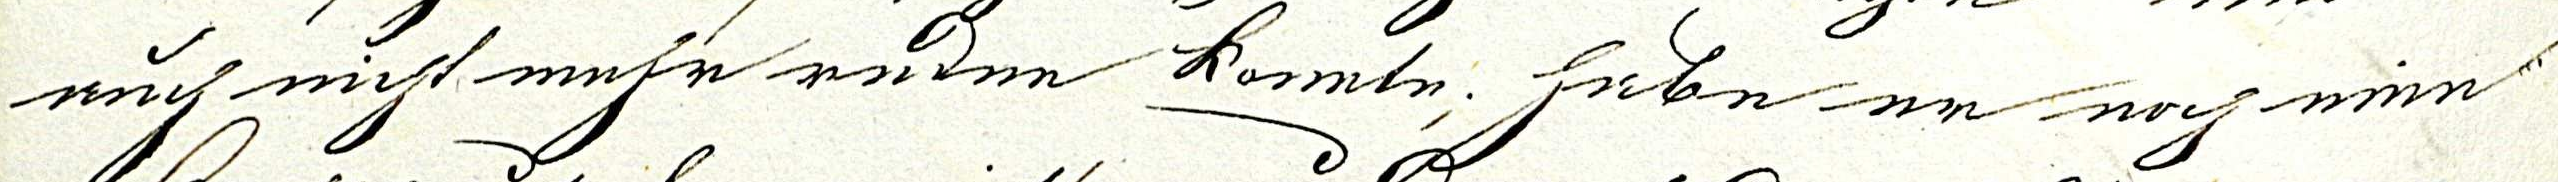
auch nicht mehr reden konnte, habe er noch eine
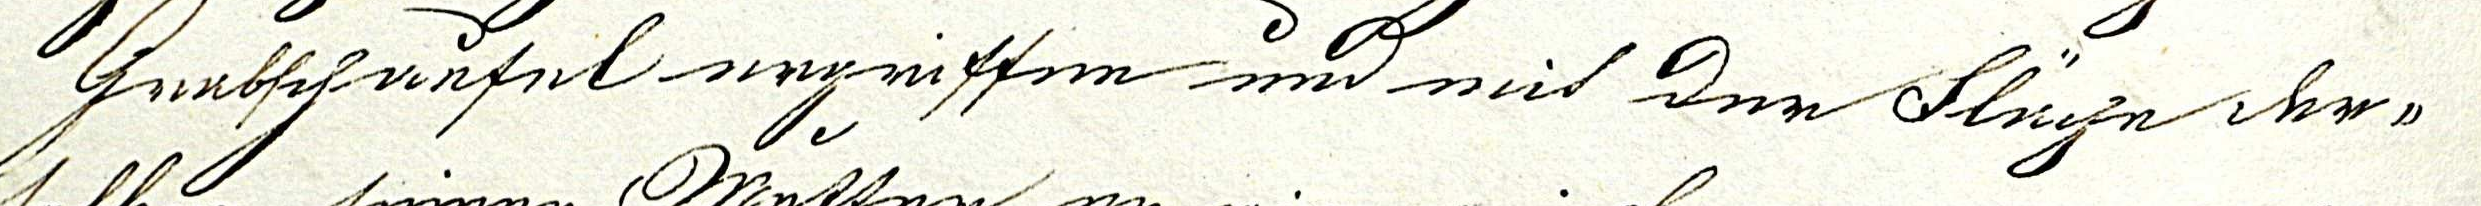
Grabschaufel ergriffen und mit der Fläche der¬
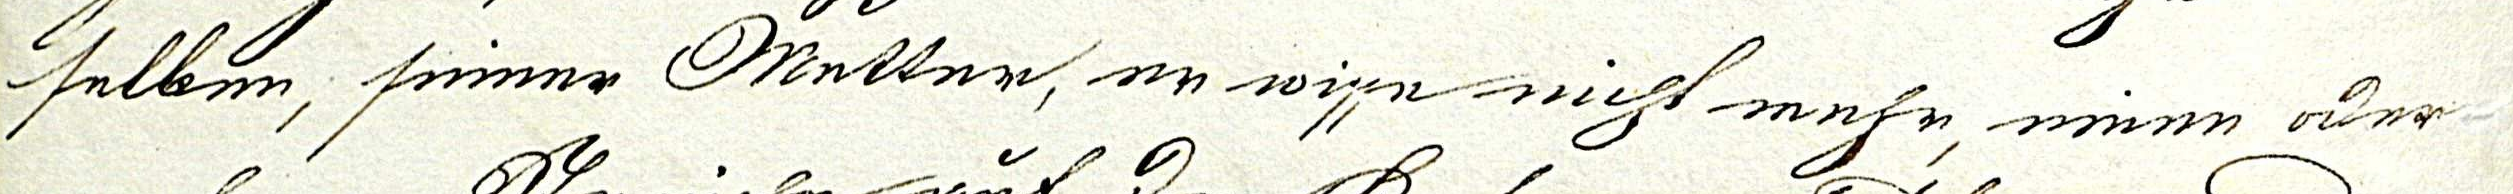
selben, seiner Mutter, er wisse nicht mehr, einen oder
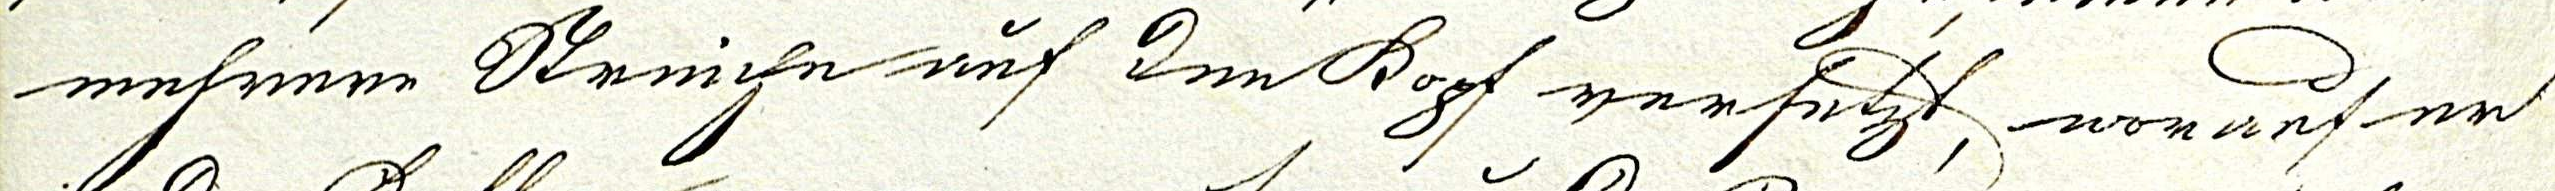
mehrere Streiche auf den Kopf versetzt, worauf er
